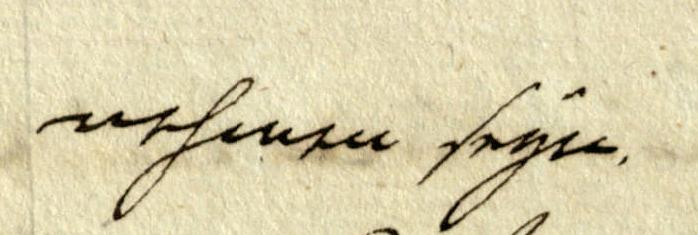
nehmen seÿn.
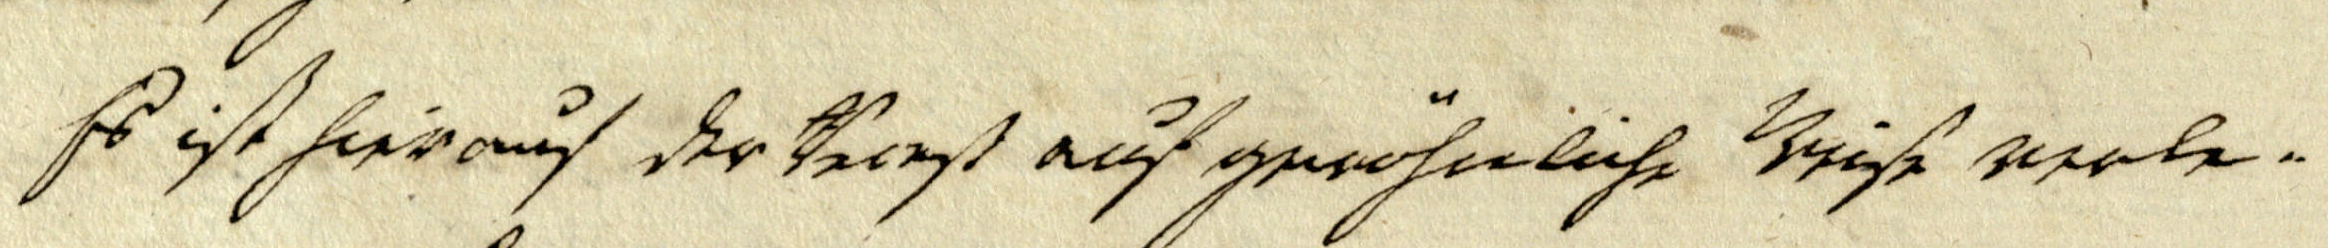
Es ist hierauf der Receß auf gewöhnliche Weise verle¬
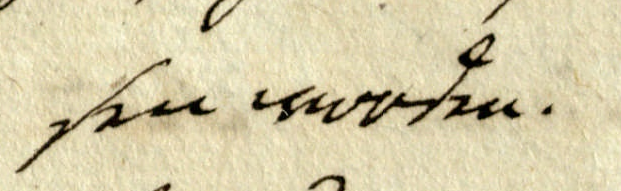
sen worden.
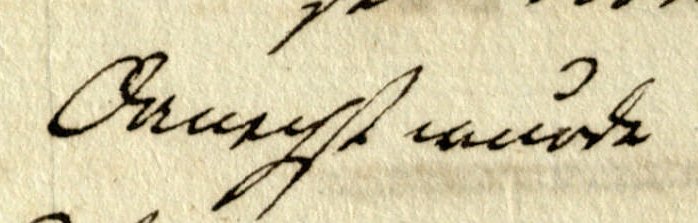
Danechst wurde
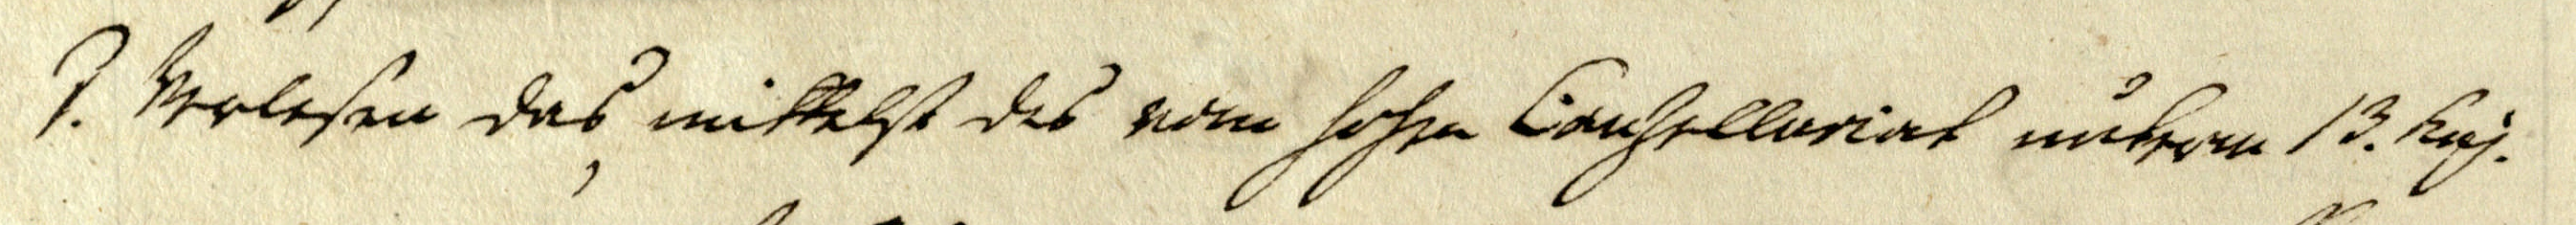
1. Verlesen das mittelst vom hohen Canzellariat unterm 13. huj.
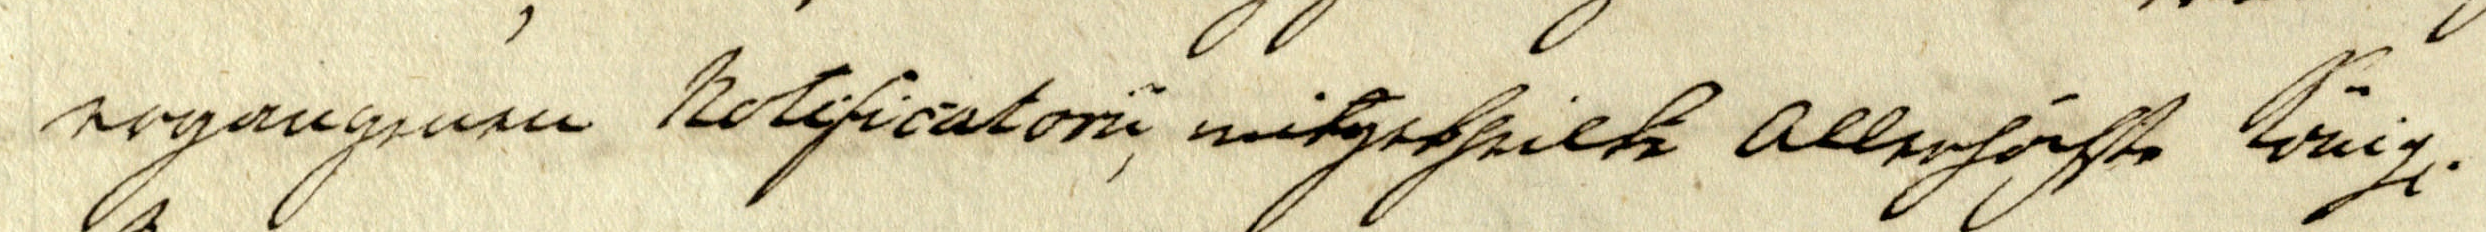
ergangenen Notificatorii, mitgetheilte Allerhöchste Königl.
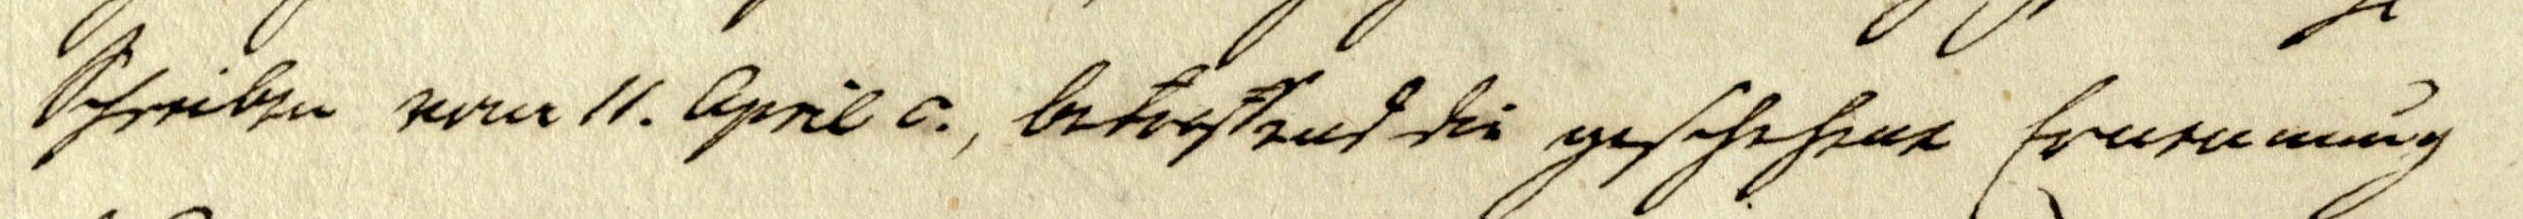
Schreiben vom 11. April c., betreffend die geschehene Ernennung
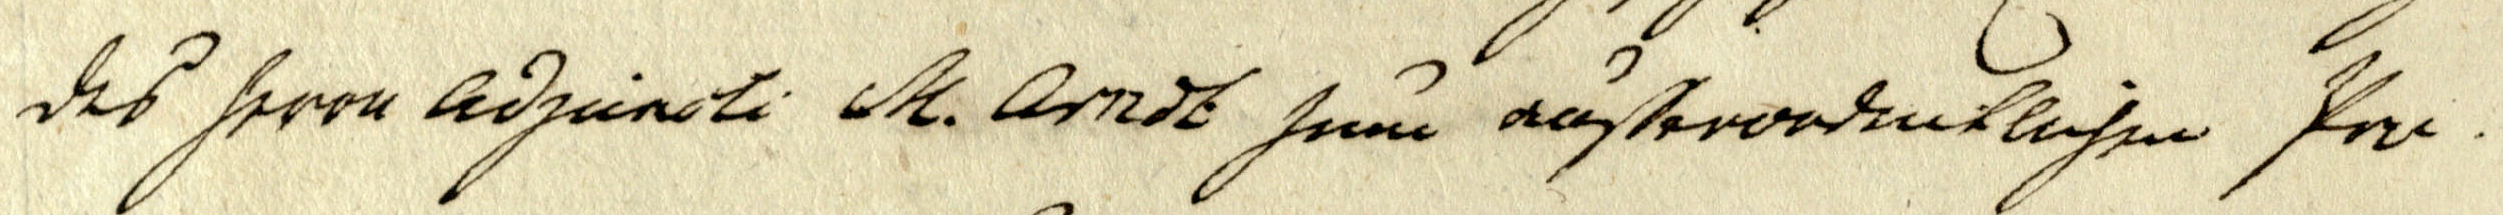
des herrn Adjuncti M. Arndt zum ausserordentlichen Pro¬
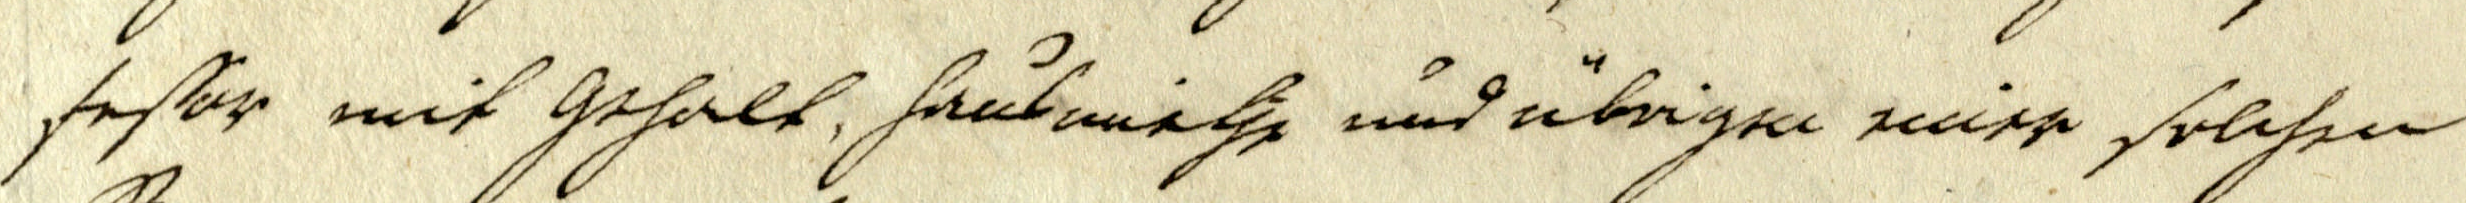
fessor mit Gehalt, hausmiethe und übrigen einer solchen
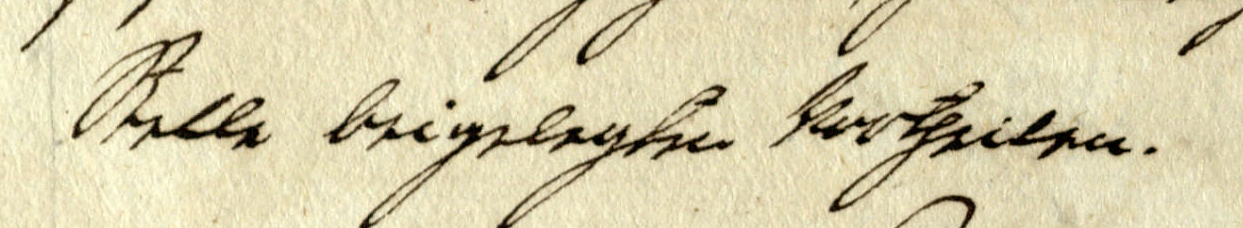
Stelle beigelegten Vortheilen.
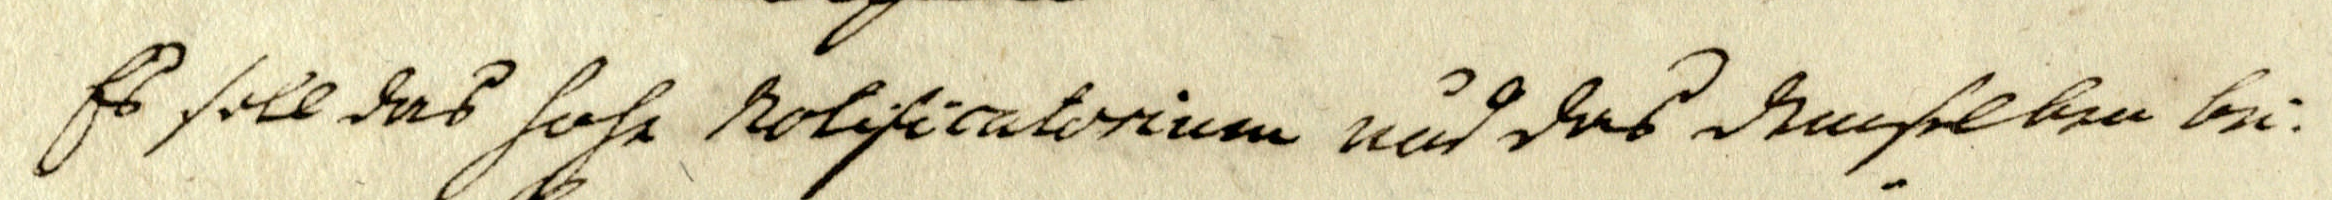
Es soll das hohe Notificatorium und das demselben bei¬
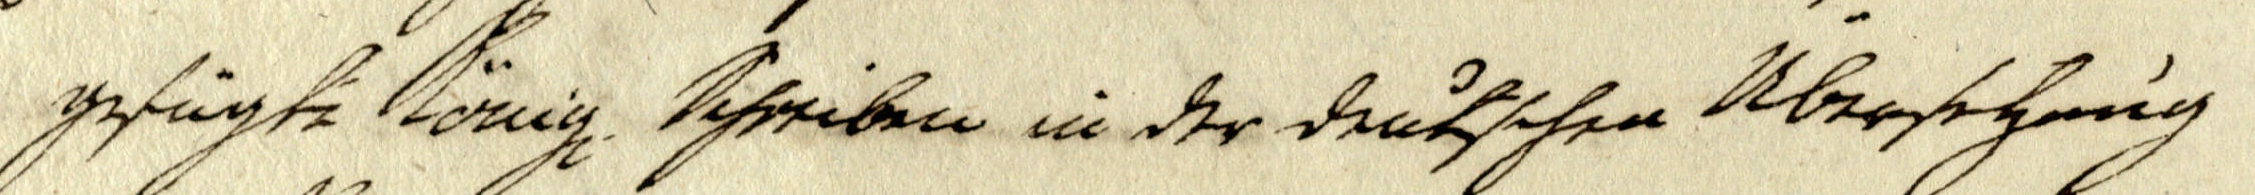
gefügte König. Schreiben in der deutschen Übersetzung
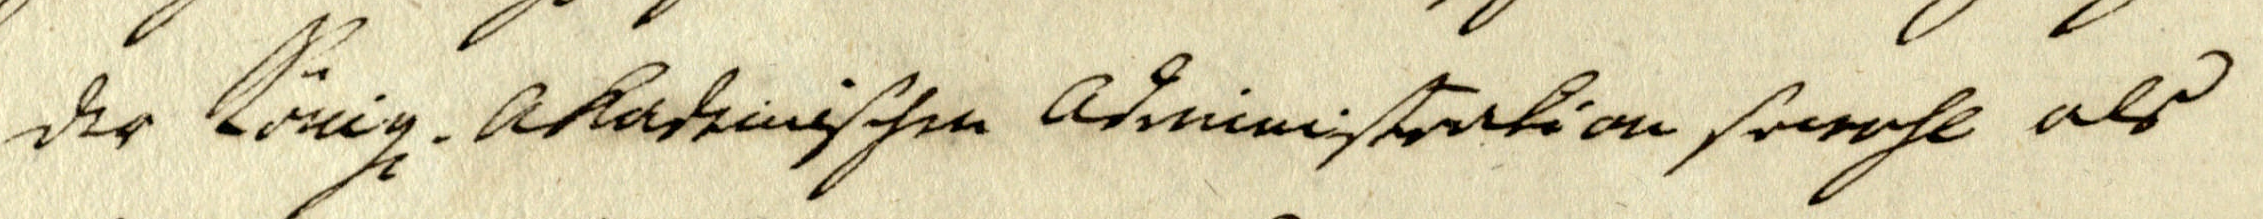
der König. Akademischen Administration sowohl als
